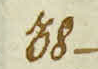38
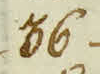36
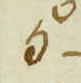5
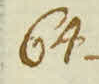64
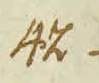42
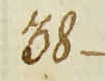38
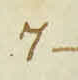7
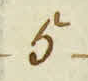5
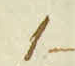1
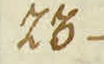23
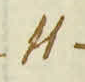11
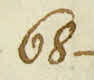68
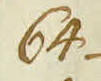64
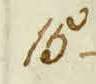15
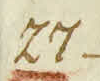27
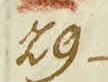29
